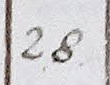28
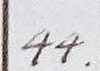44
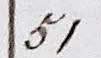51
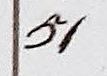51
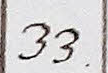33
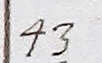43
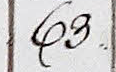63
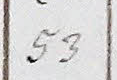53
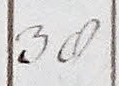38
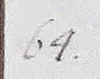64
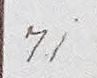71
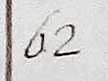62
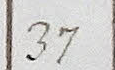37
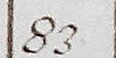83
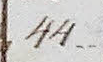44
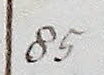85
